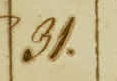31.
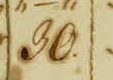30.
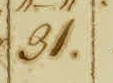31.
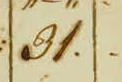31.
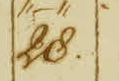28.
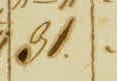31.
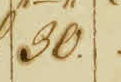30.
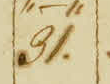31.
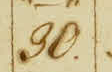30.
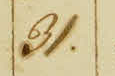31.
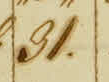31.
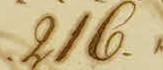216.
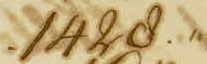1428.
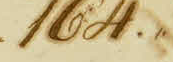164.
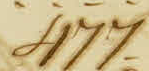477
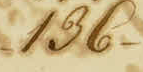136
